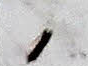1
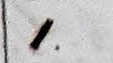1.
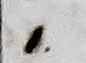1.
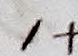1
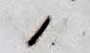1.
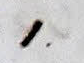1.
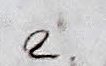2.
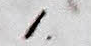1.
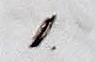1.
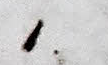1.
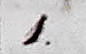1.
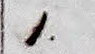1.
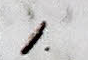1.
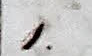1.
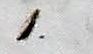1.
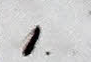1.
